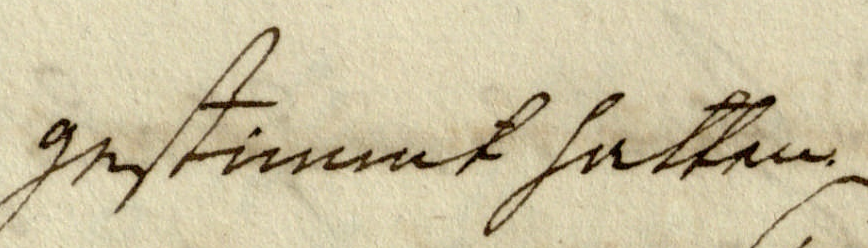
gestimmt hatten.
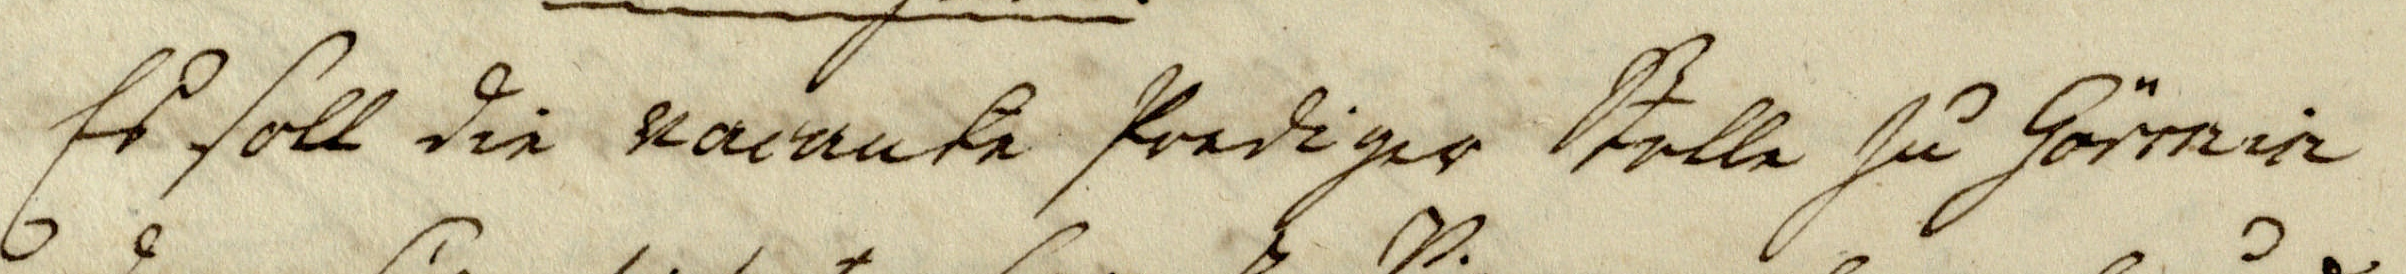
Es soll die vacante Prediger Stelle zu Görmin
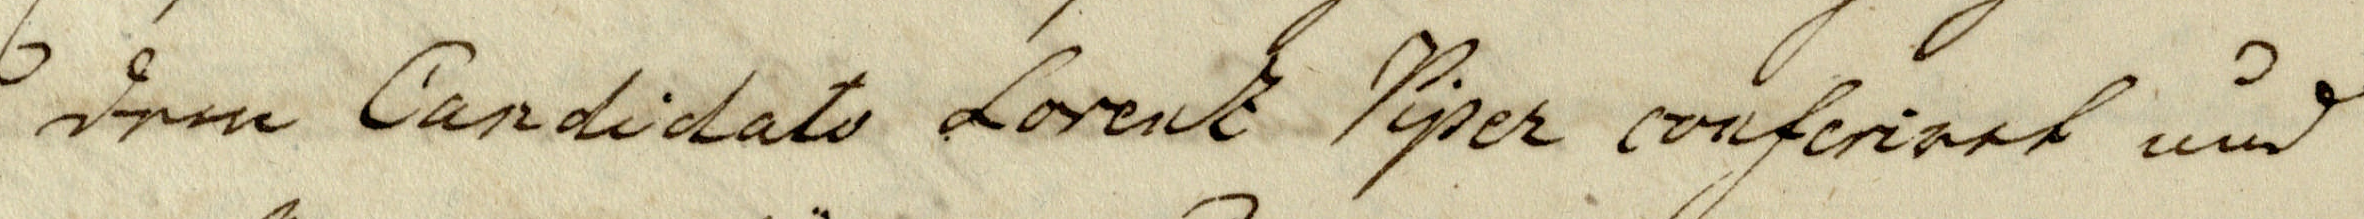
dem Candidato Lorenz Piper conferiret und
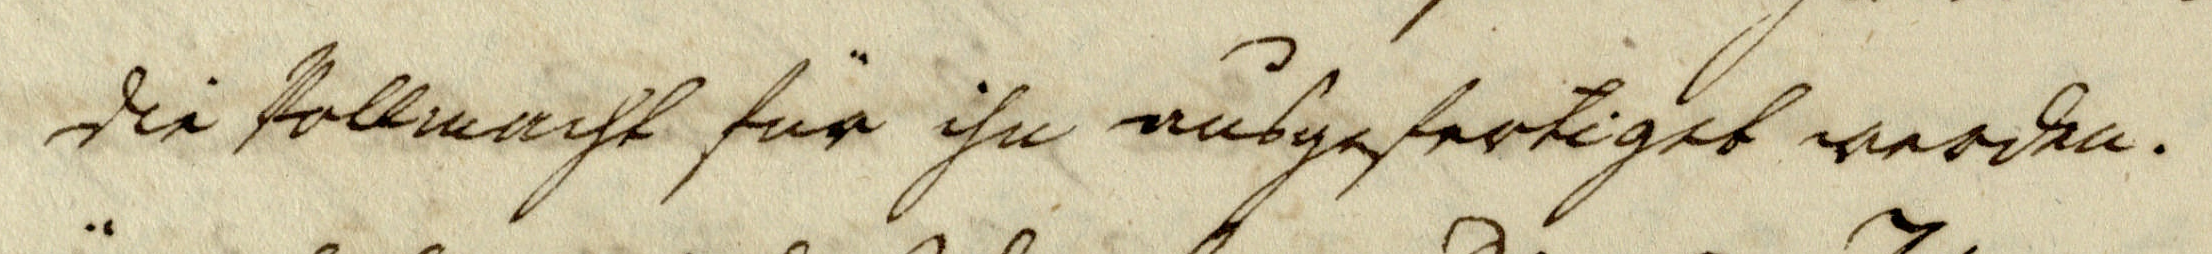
die Vollmacht für ihn ausgefertiget werden.
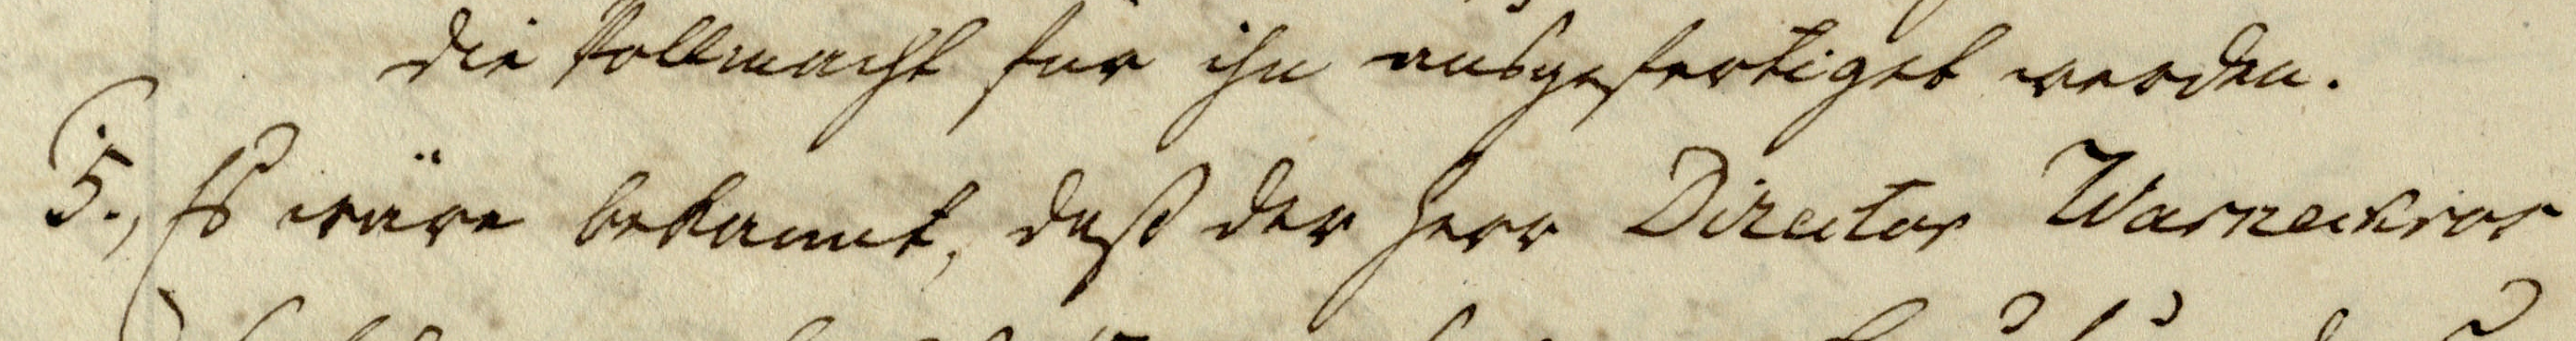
3., Es wäre bekannt, daß der Herr Director Warneckros
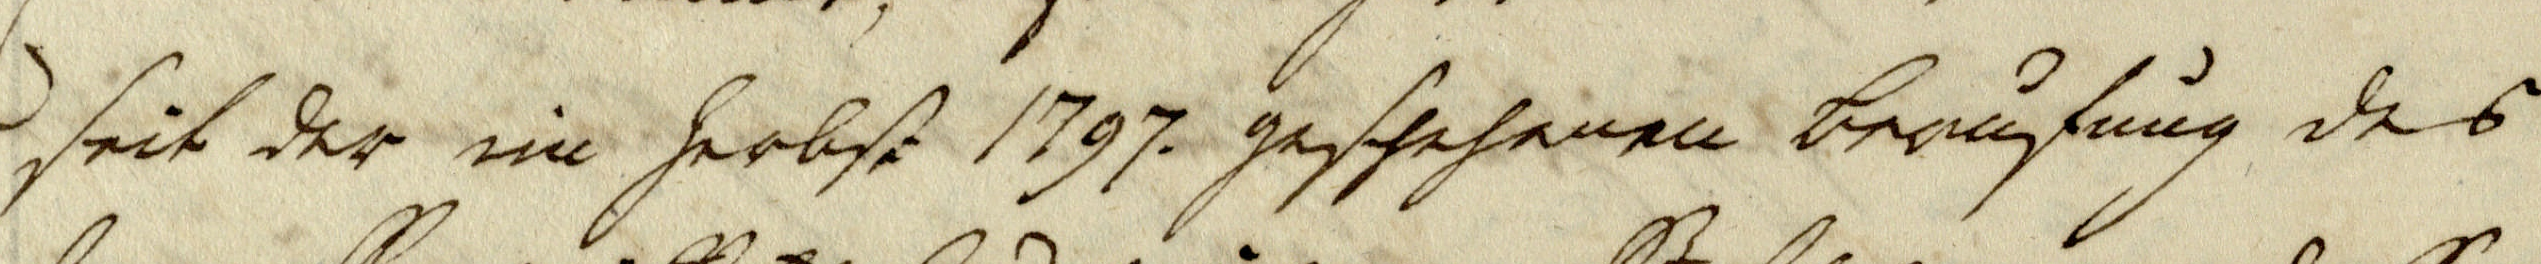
seit der im Herbst 1797. geschehenen Berufung des
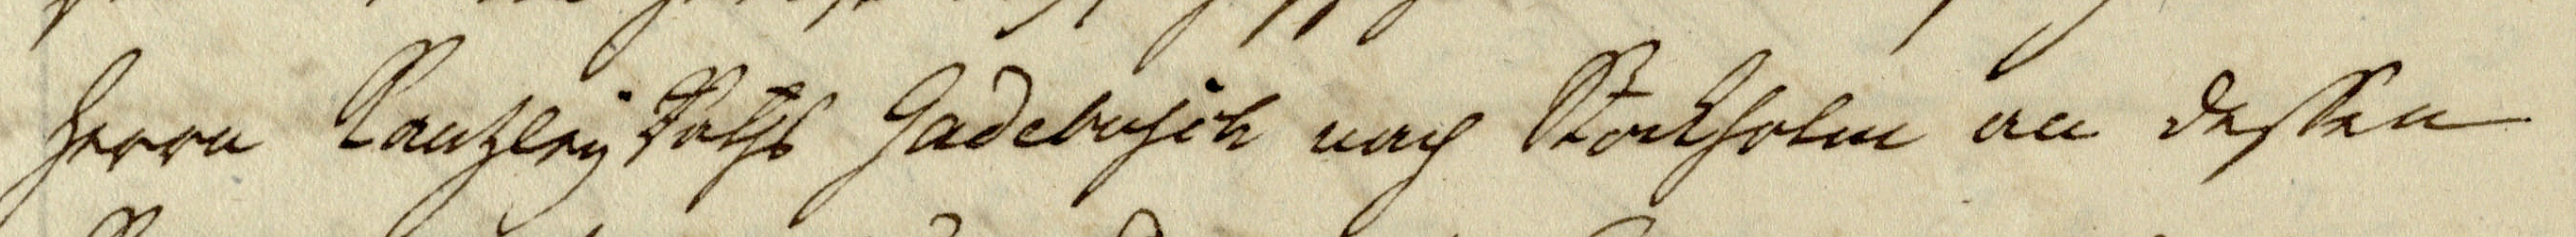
Herrn Kanzley Raths Gadebusch nach Stockholm an dessen
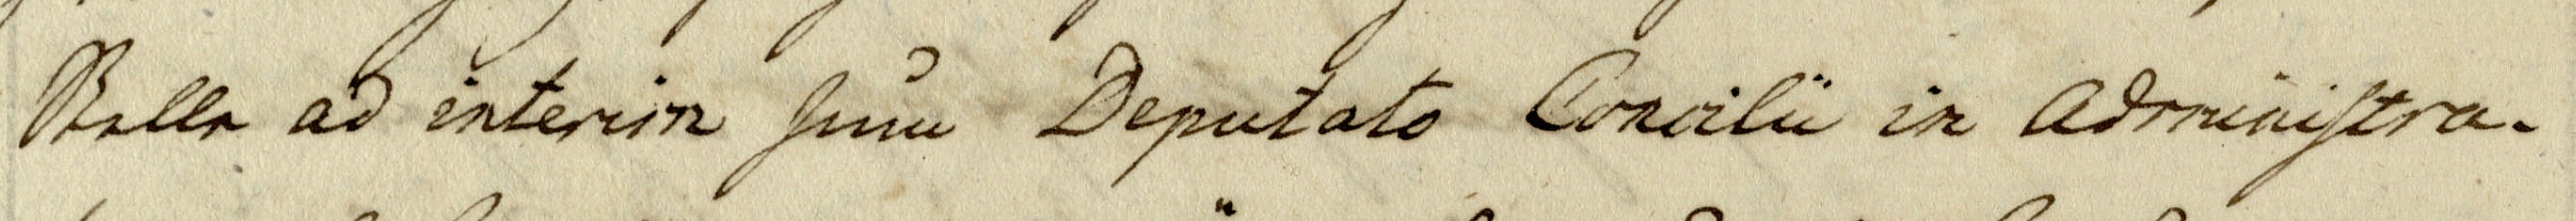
Stelle ad interim zum Deputato Concilii in Administra-
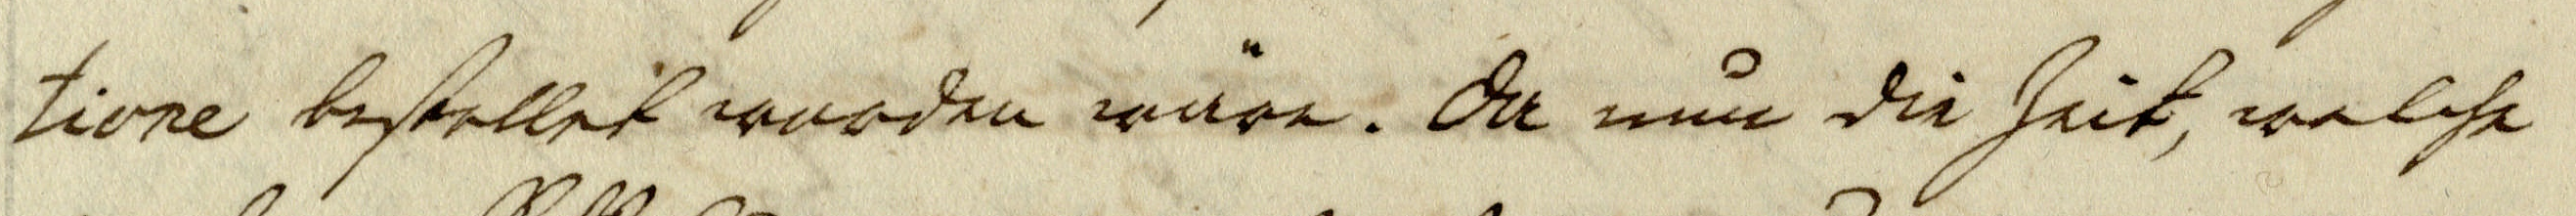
tione bestellet würden wäre. Da nun die Zeit, welche
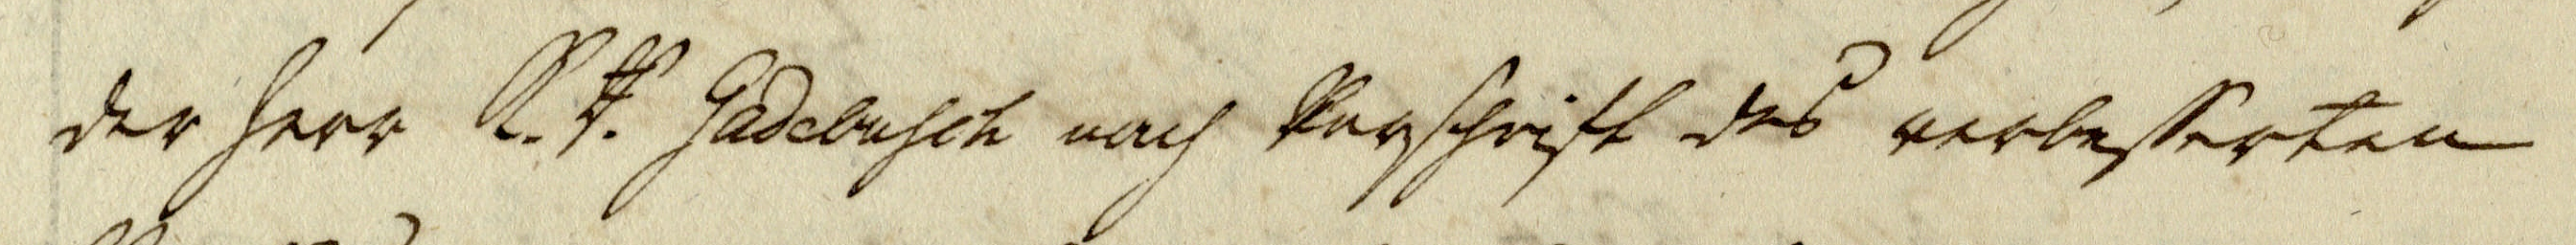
der Herr K. R. Gadebusch nach Vorschrift des verbesserten
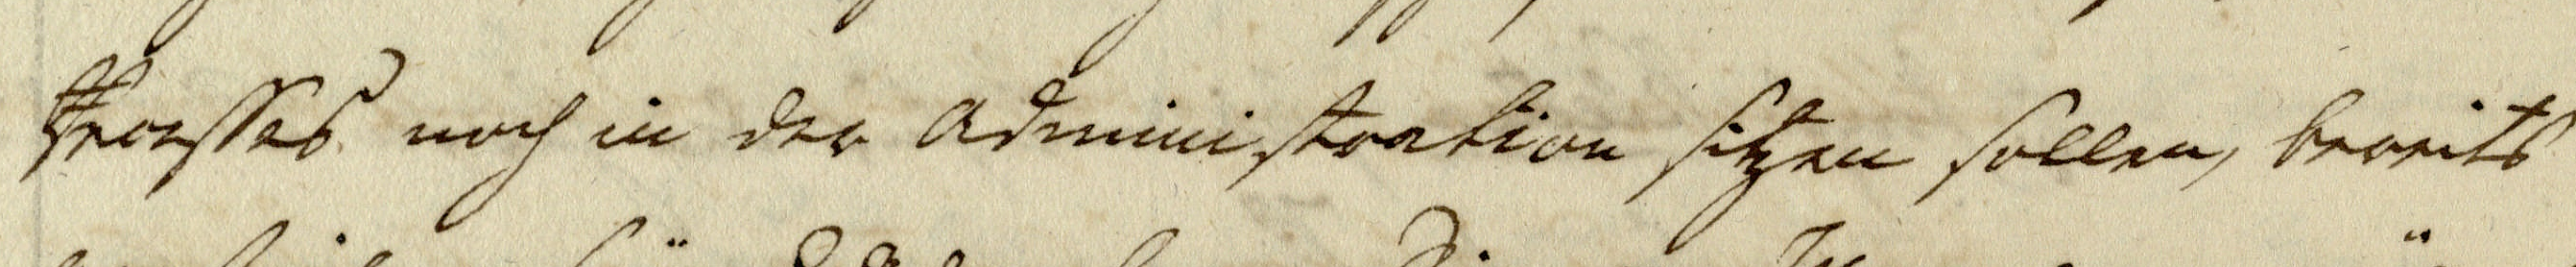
Recesses noch in der Administration sitzen sollen, bereits
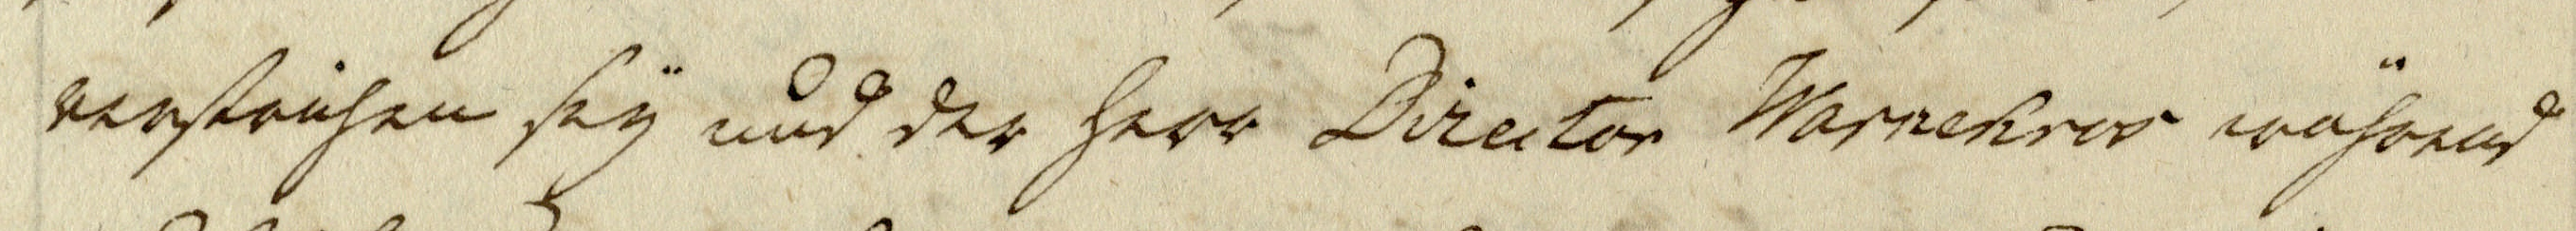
verstrichen seÿ und der Herr Director Warnekros während
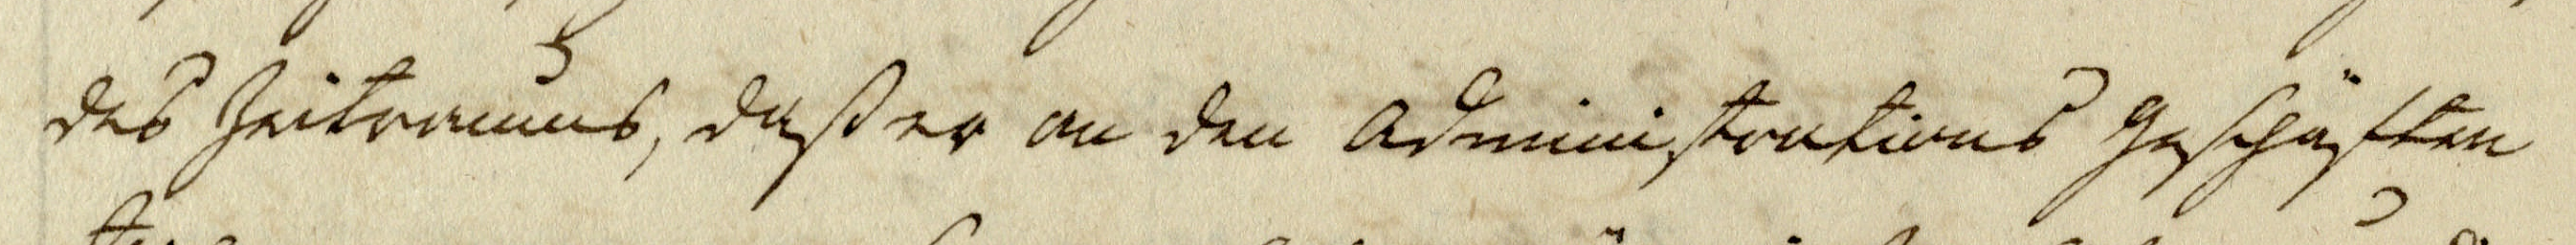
des Zeitraums, daß er an den Administrations Geschäften
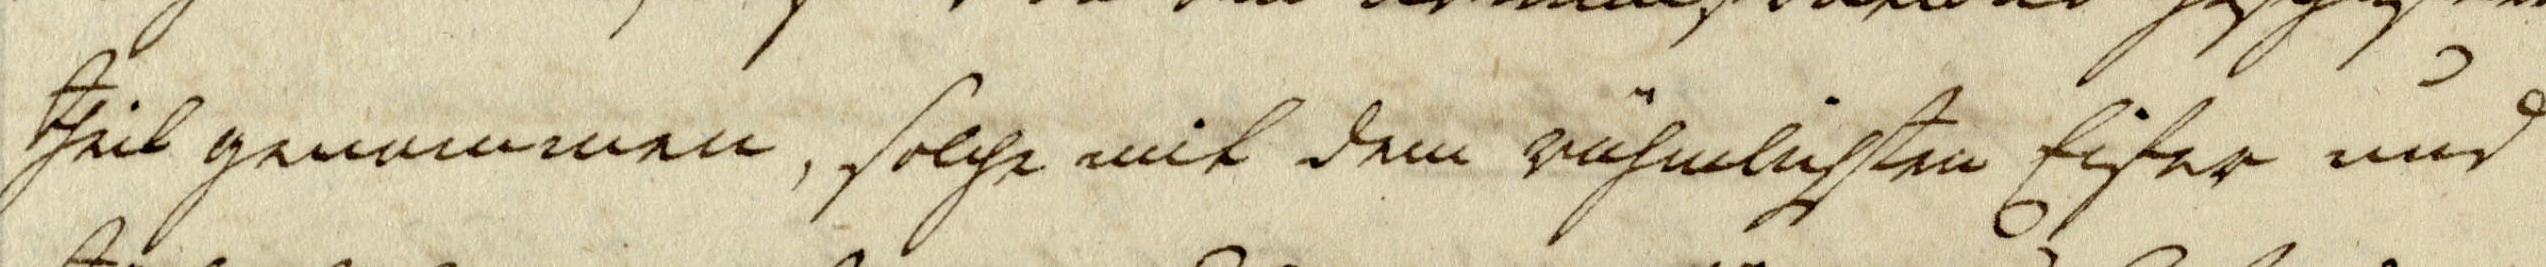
Theil genommen, solche mit dem rühmlichsten Eifer und
